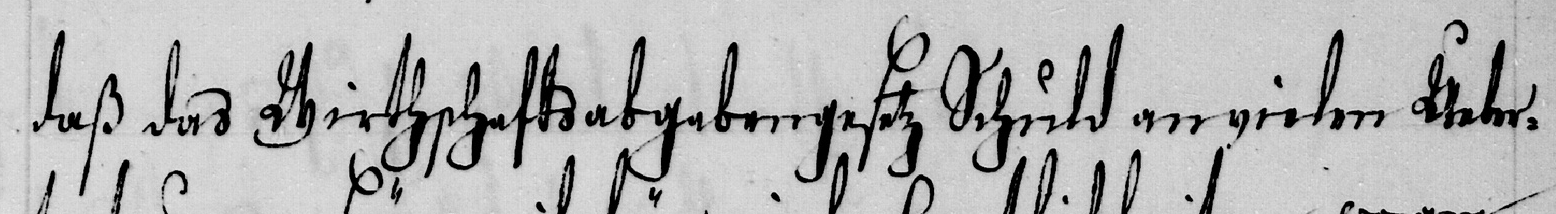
daß das Wirthschaftsabgabengesetz Schuld an vielen Ueber¬
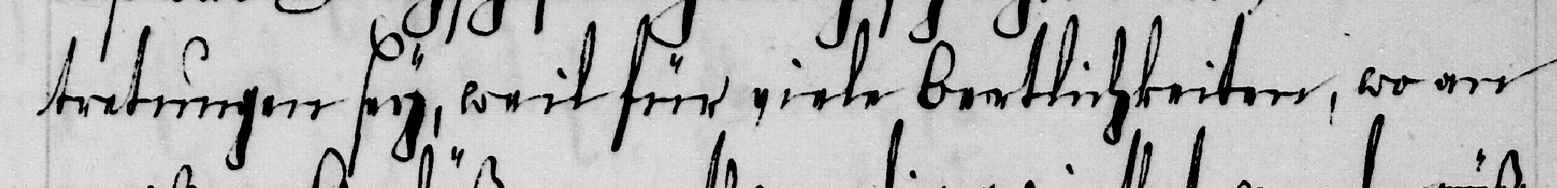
tretungen sey, weil für viele Oertlichkeiten, wo an
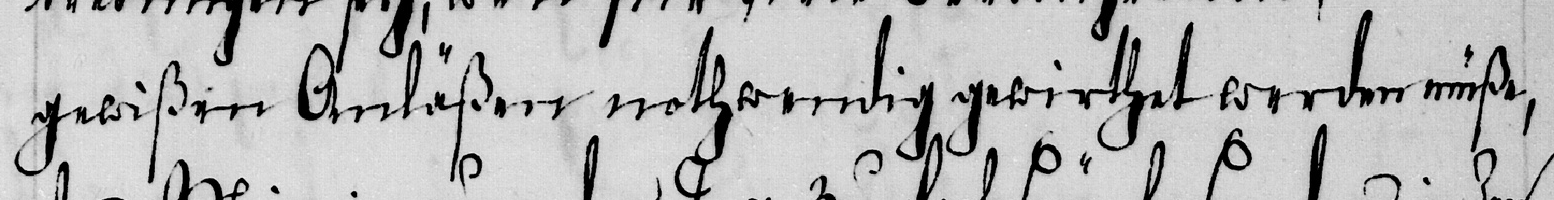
gewißen Anläßen nothwendig gewirthet werden müße,
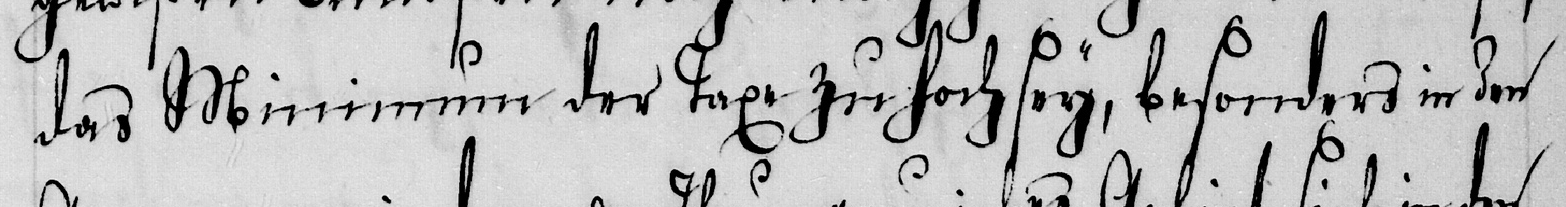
das Minimum der Taxe zu hoch sey, besonders in den
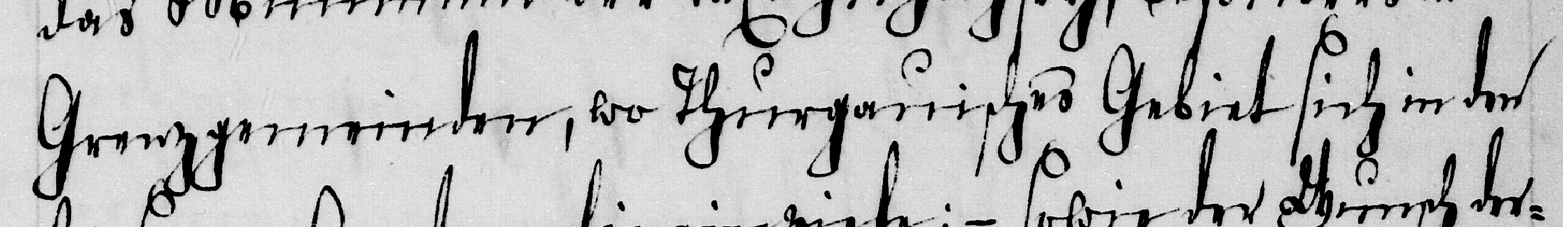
Grenzgemeinden, wo Thurgauisches Gebiet sich in den
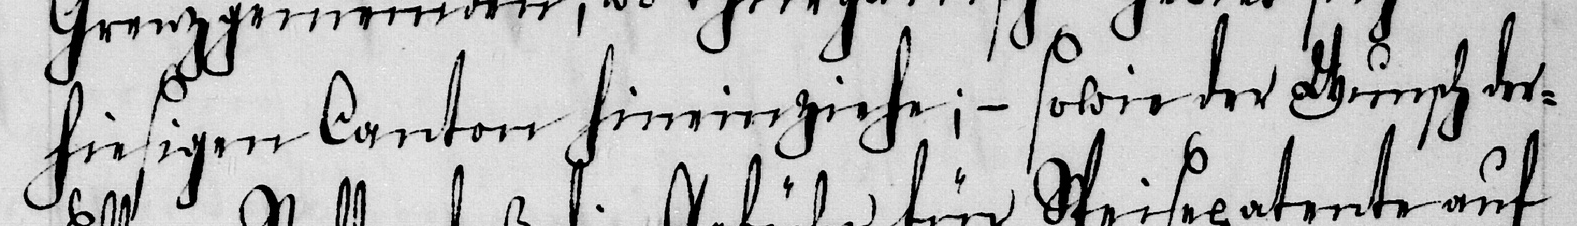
hiesigen Canton hineinziehe; – sowie der Wunsch der¬
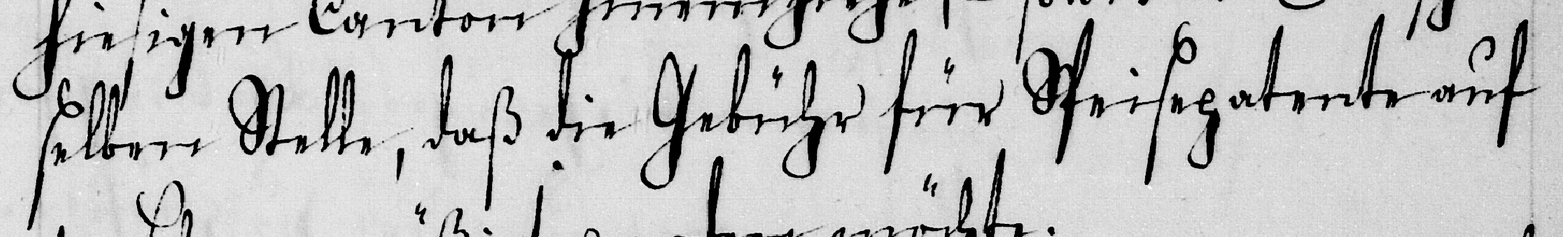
selben Stelle, daß die Gebühr für Speisepatente auf
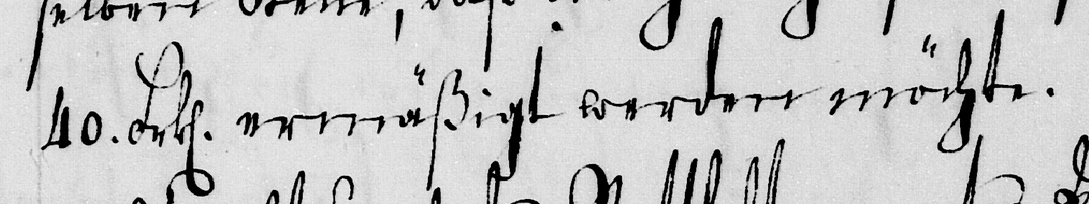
40. Frk[en]. ermäßigt werden möchte.
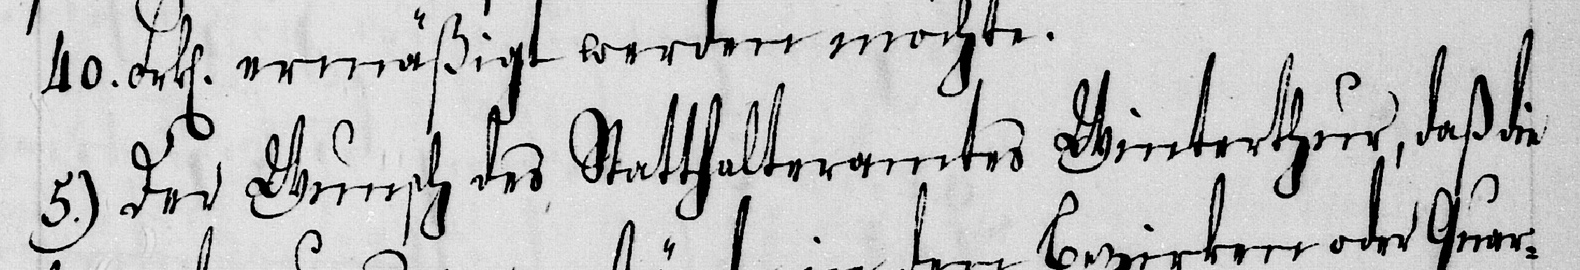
5.) Der Wunsch des Statthalteramtes Winterthur, daß die
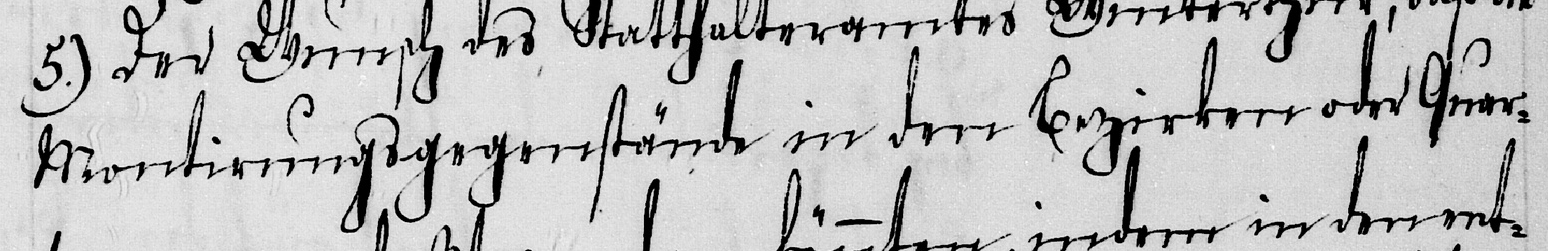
Montirungsgegenstände in den Bezirken oder Quar¬
